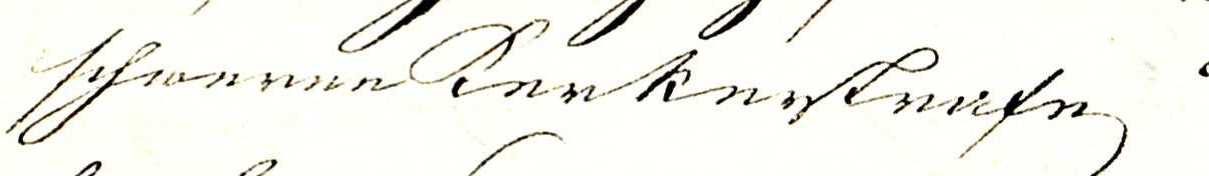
oberste Gerichtshof die Verhängung einer 20 jährigen
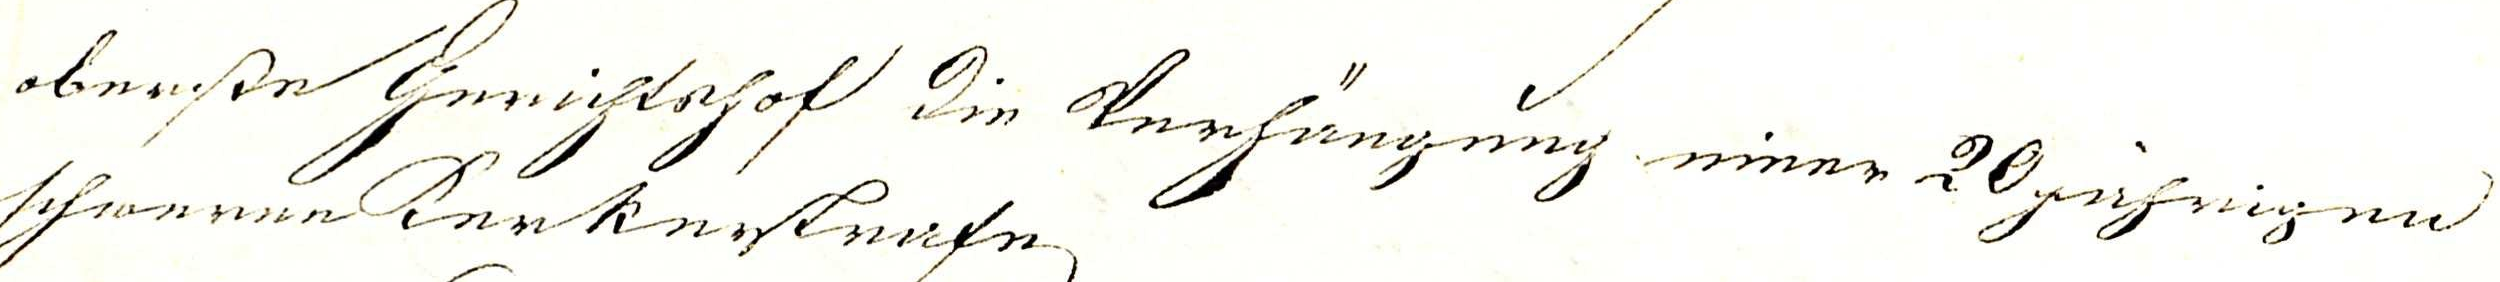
schweren Kerkerstrafe
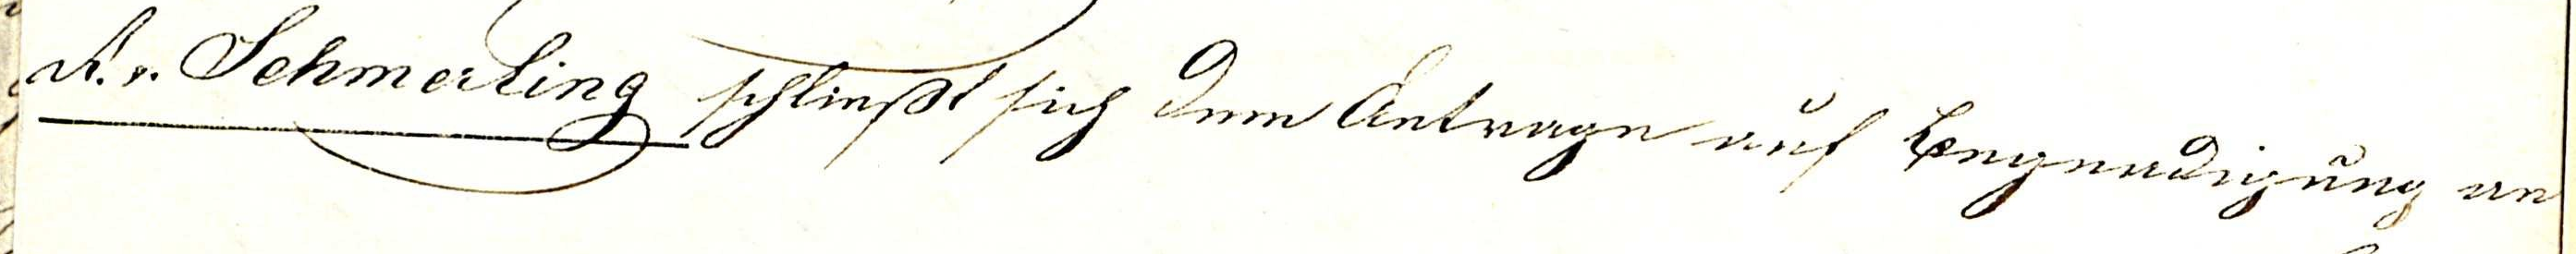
R. v. Schmerling schließt sich dem Antrage auf Begnadigung an
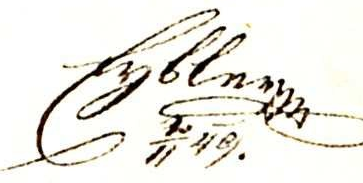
Eyblerxx
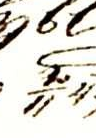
xx
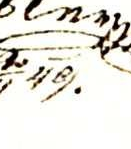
49.
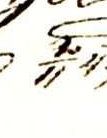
11
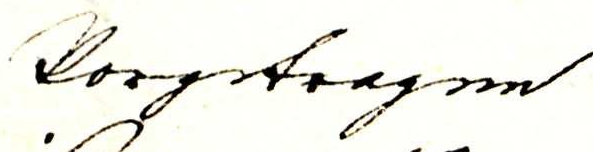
Vorgetragen
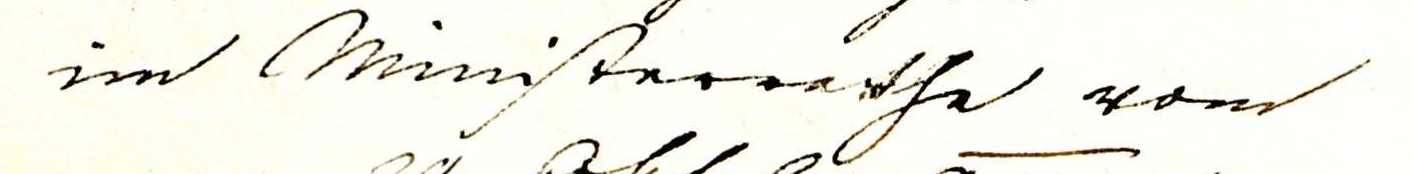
im Ministerrathe vom
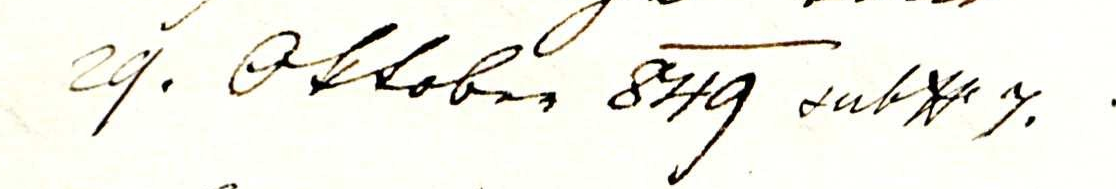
29. Oktober 849 xx
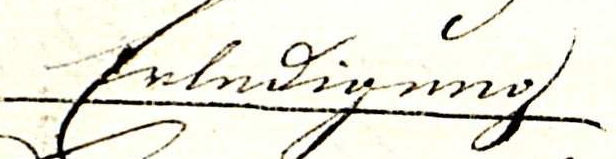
Erledigung
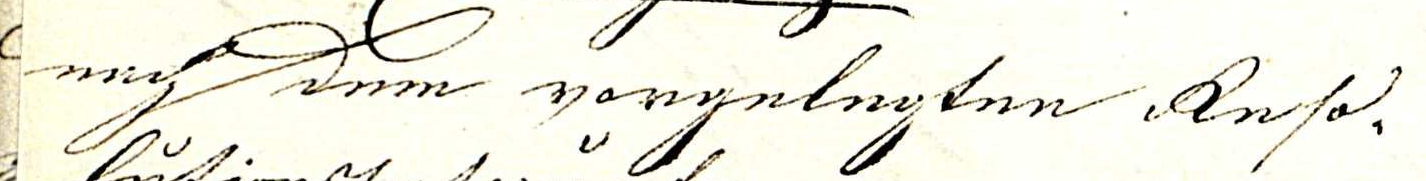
nach dem vorgelegten Reso¬
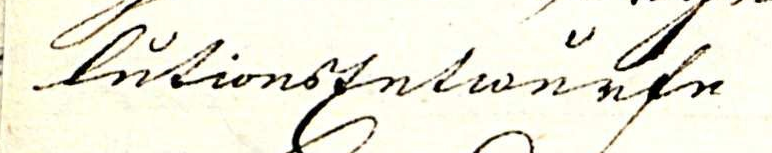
lutions Entwurfe
